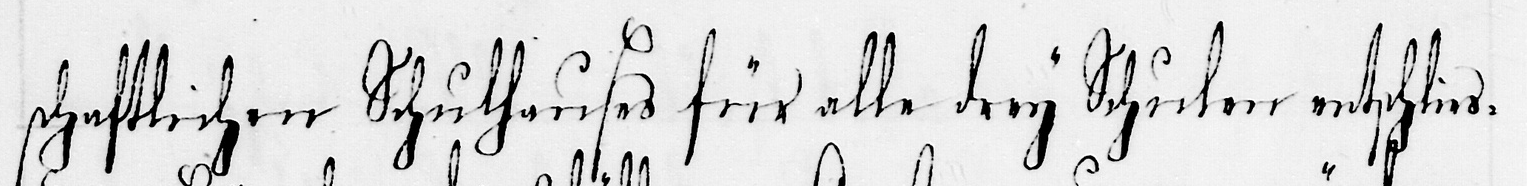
schaftlichen Schulhauses für alle drey Schulen entschli¬
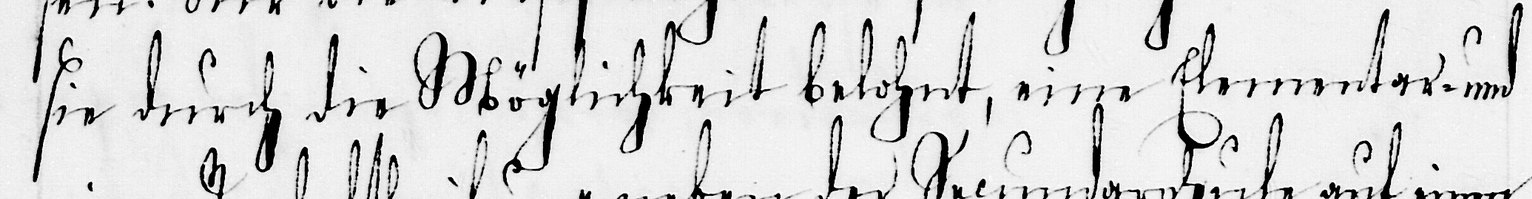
sie durch die Möglichkeit belohnt, eine Elementar- und
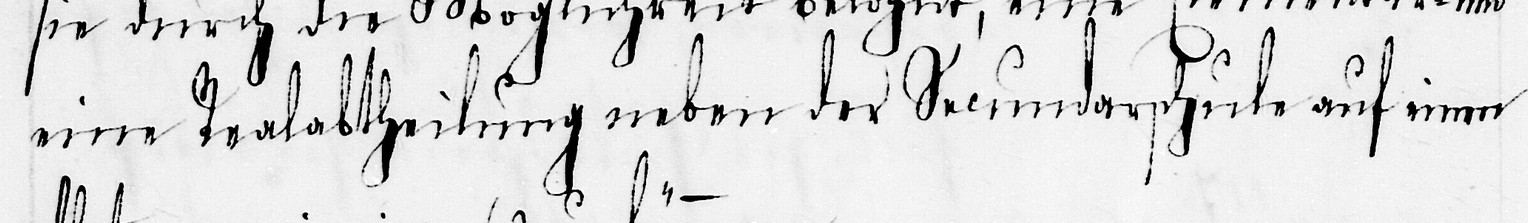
eine Realabtheilung neben der Secundarschule auf einen
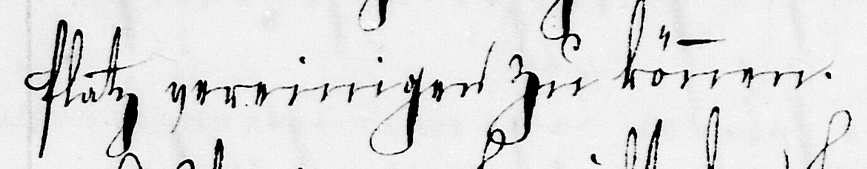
Platz vereinigen zu können.
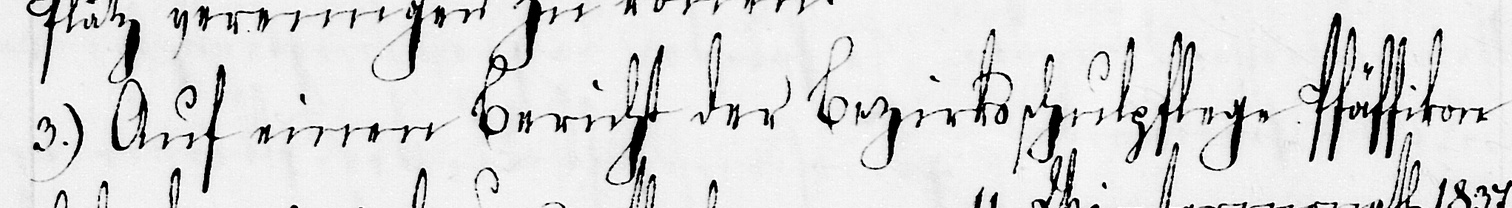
3.) Auf einen Bericht der Bezirksschulpflege Pfäffi¬
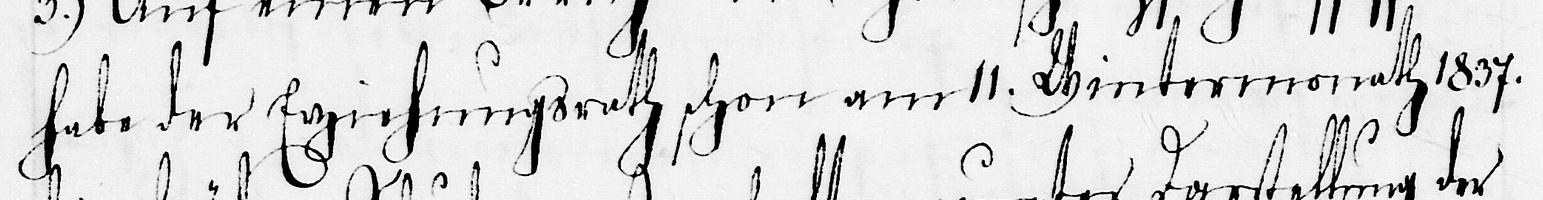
habe der Erziehungsrath schon am 11. Wintermonath 1837.
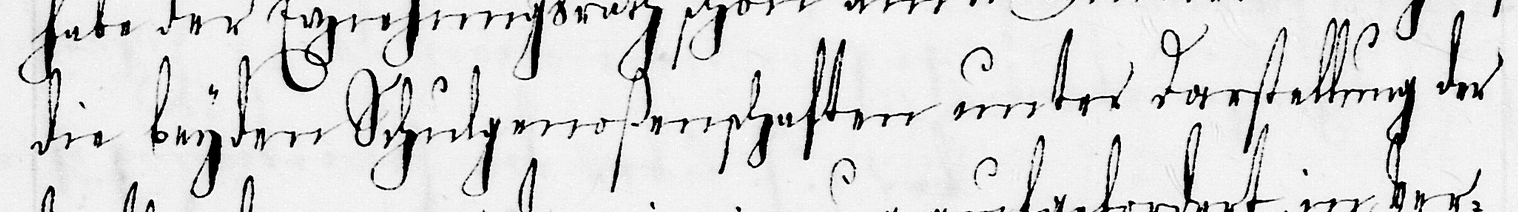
die beyden Schulgenoßenschaften unter Darstellung der
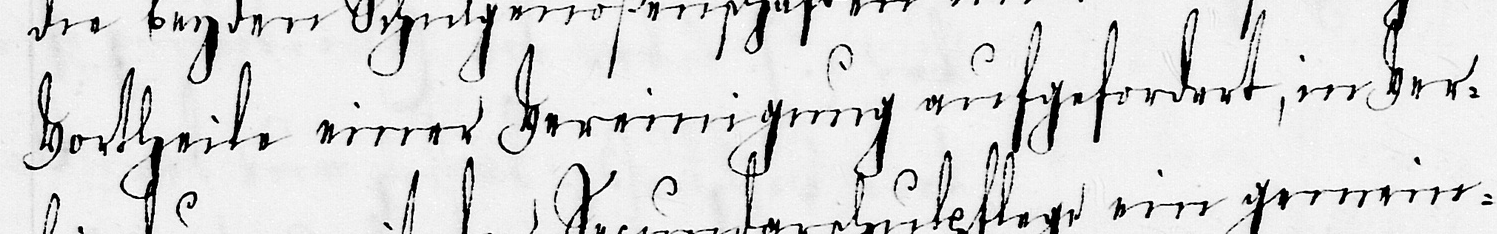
Vortheile einer Vereinigung aufgefordert, in der
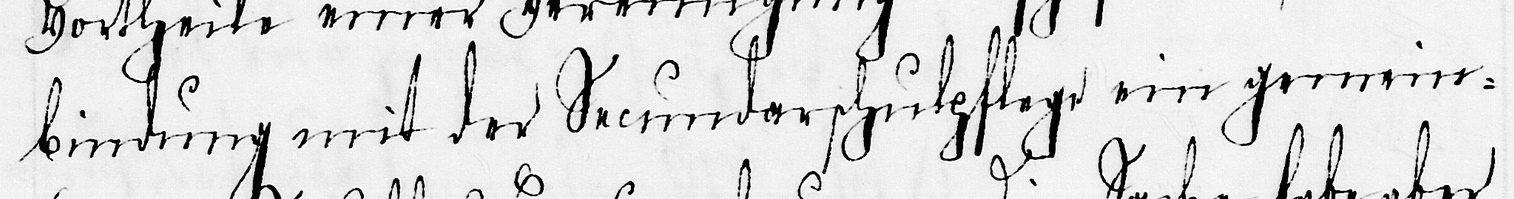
bindung mit der Secundarschulpflege ein gemein¬
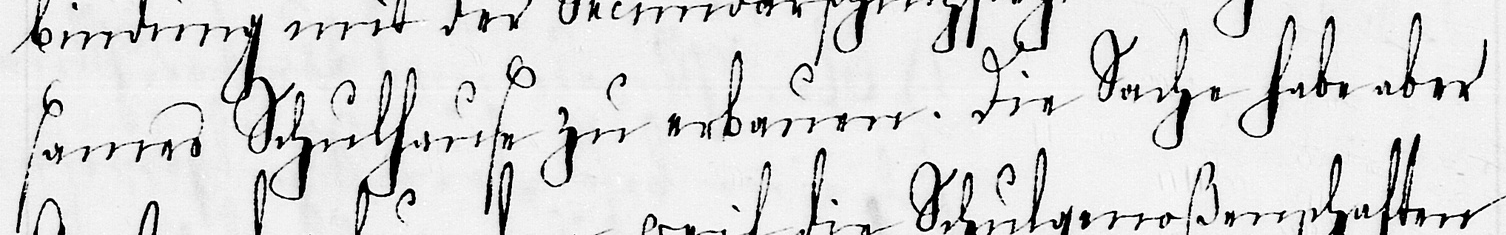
sames Schulhause zu erbauen. Die Sache habe aber
